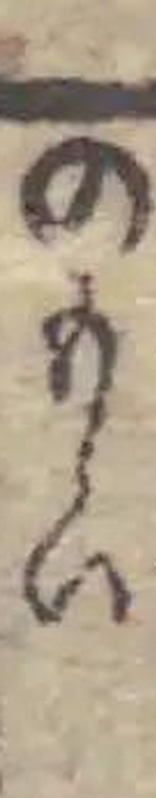のもしい
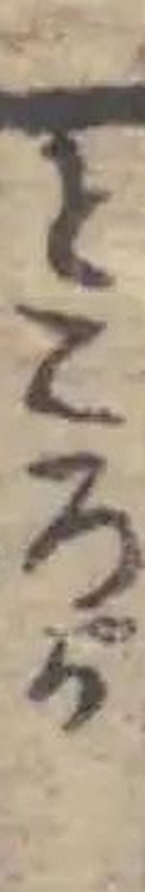ところが
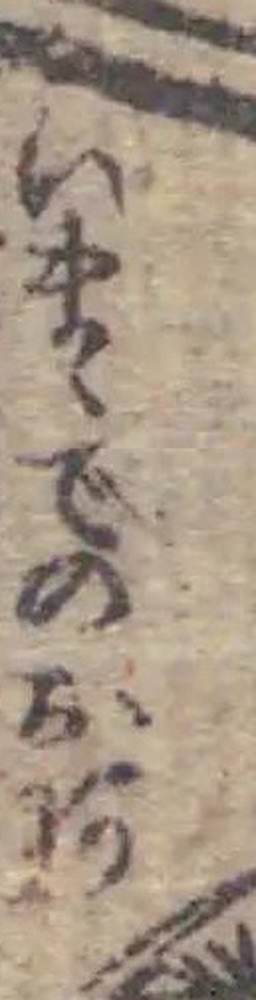いまゝでのおあ
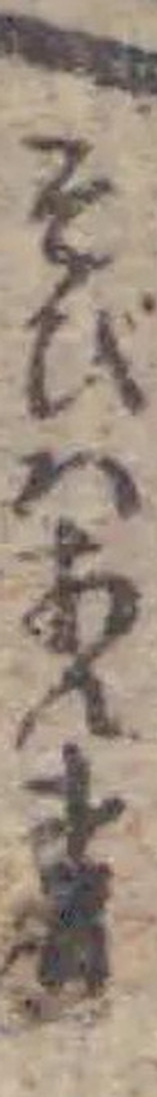そびはあんま
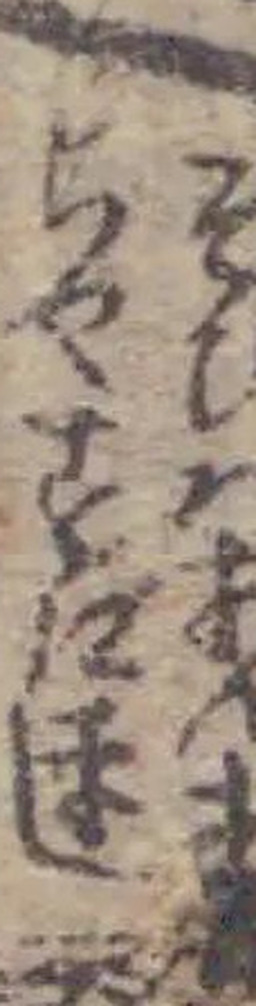ちやすきまし
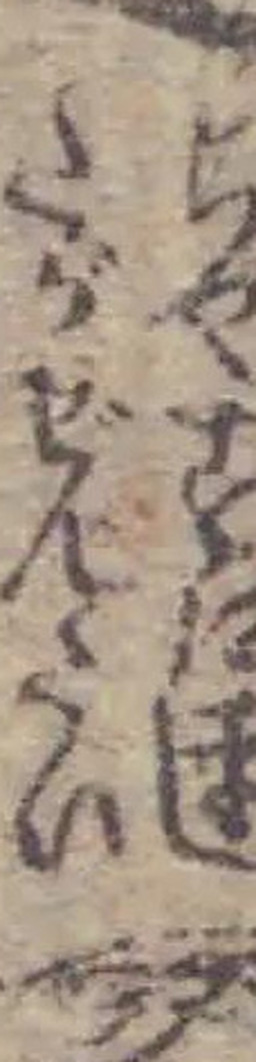たがぜんたい
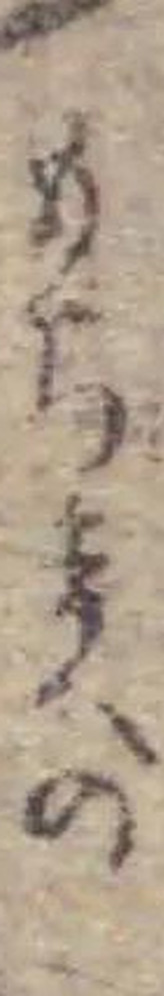もち兵への
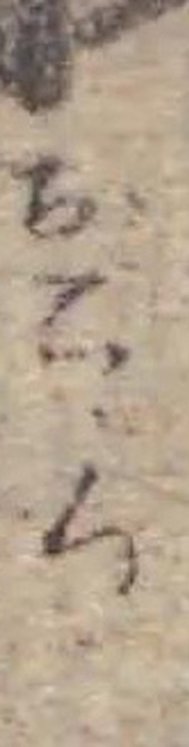おこゝろ
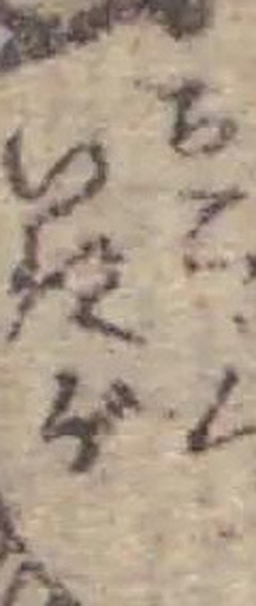いきが
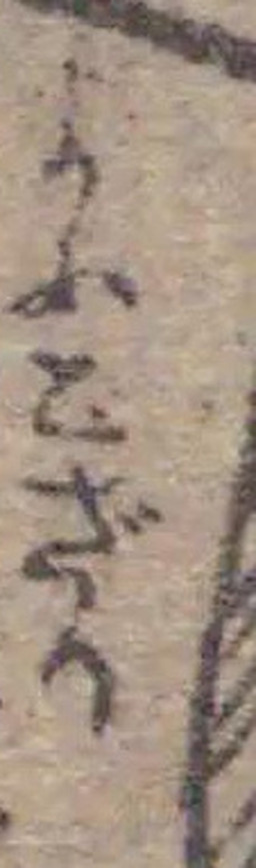よふござり
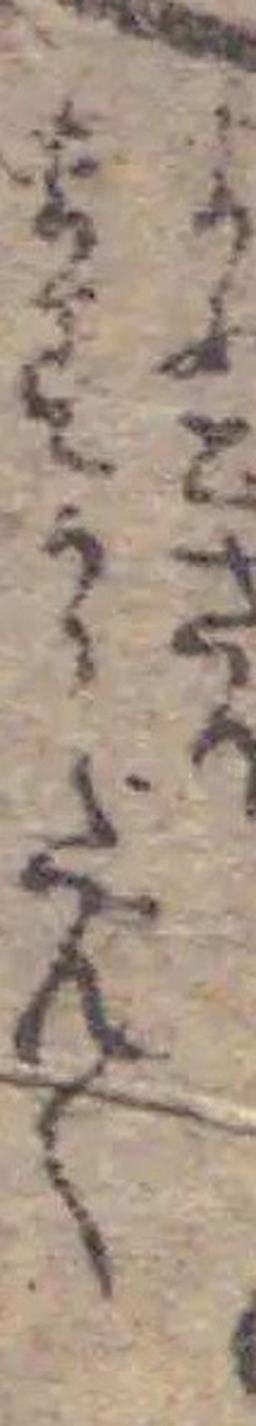ますからだん〳〵
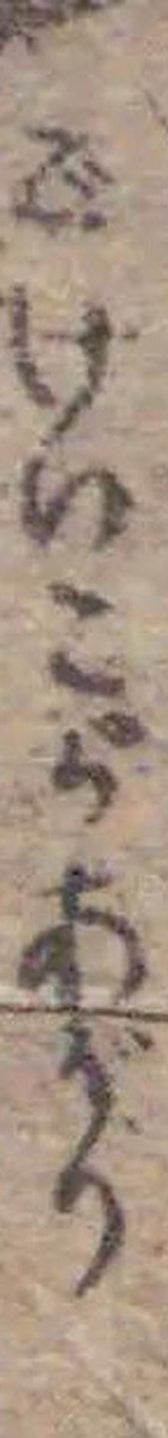ごけいこがあがり
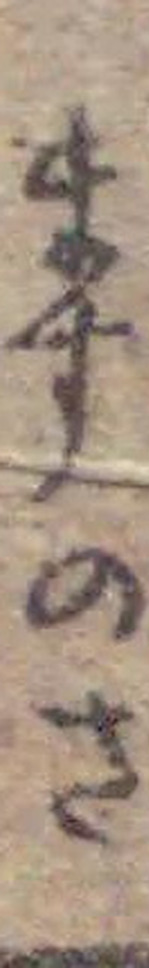ますのさ

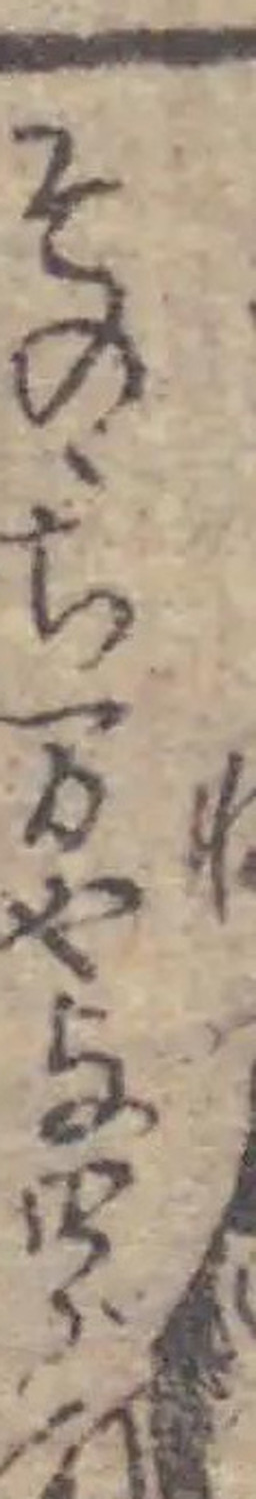そのゝち万や与四郎
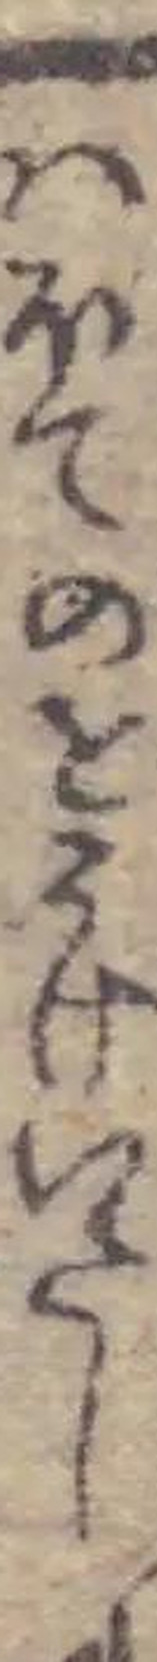はほてのをうけいたし
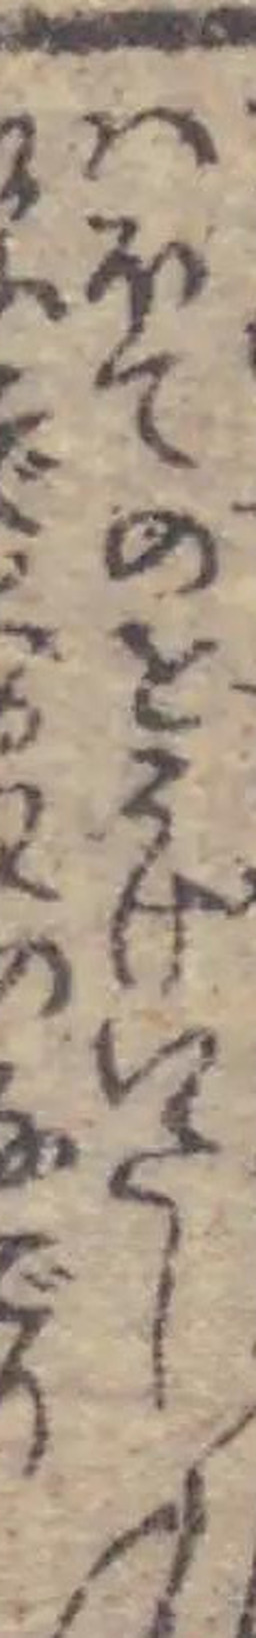けふぞいくるわのなごり
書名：色男其処此処 3巻
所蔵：国立国会図書館 National Diet Library, JAPAN
